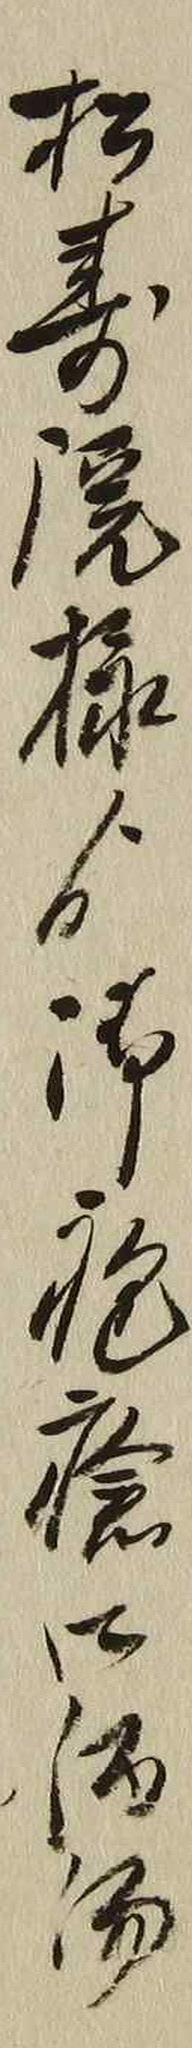松寿院様ゟ御疱瘡御酒湯
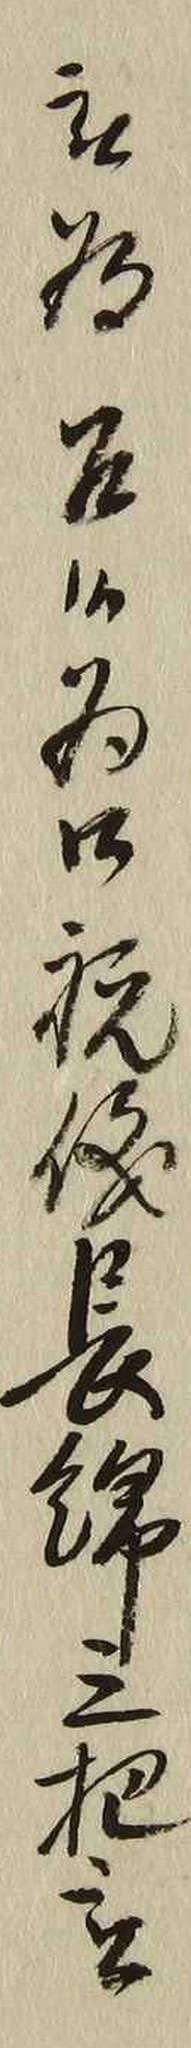被為召候為御祝儀長綿三把被
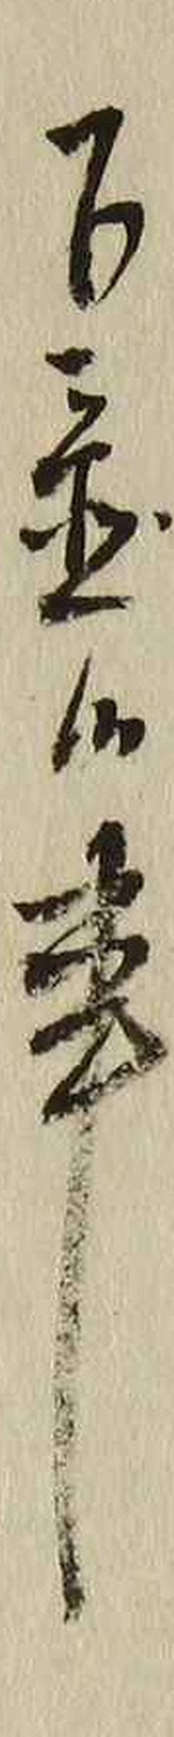下置候事
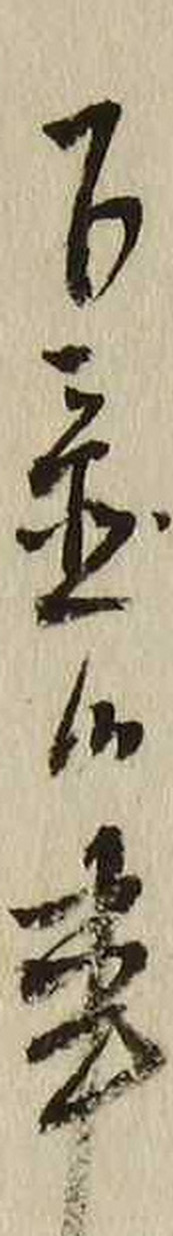下置候事
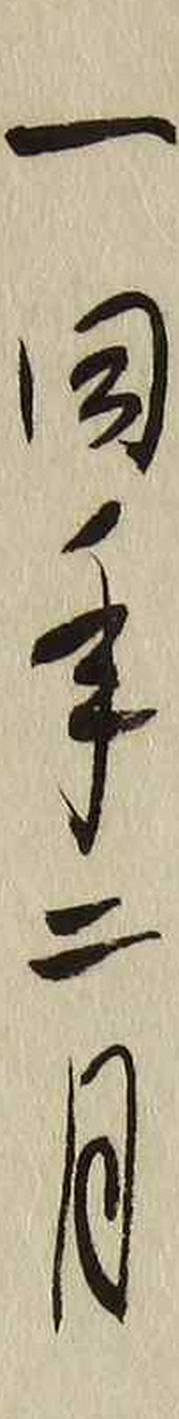一同年二月
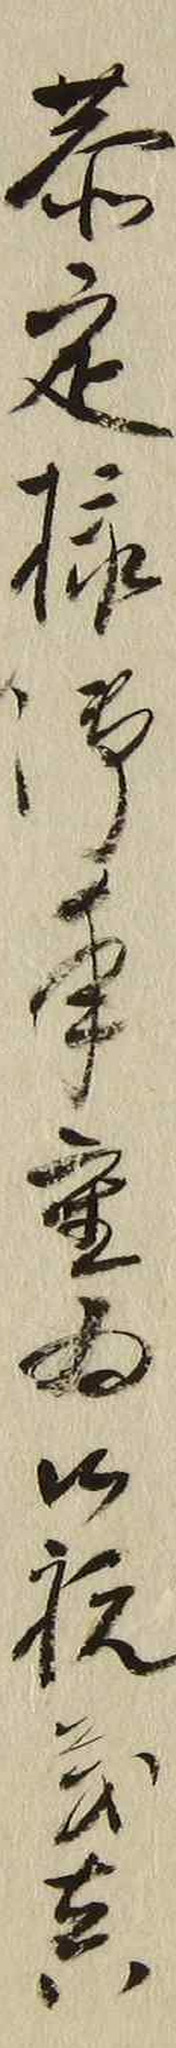恭定様御手重為御祝義真
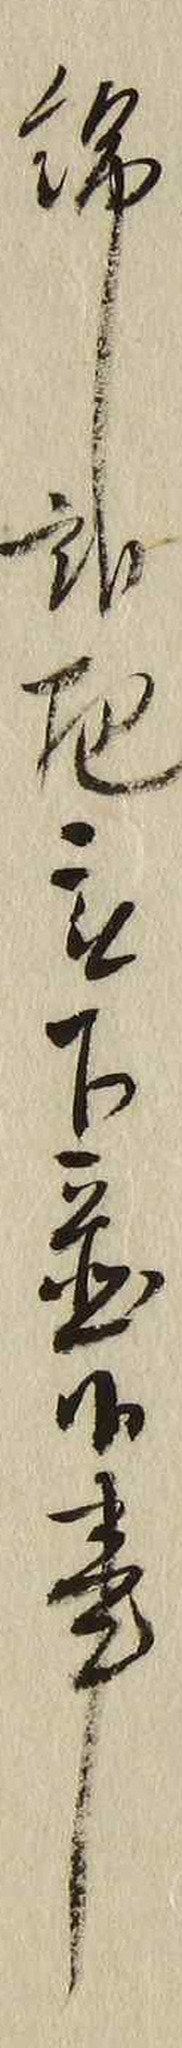綿弐把被下置候事
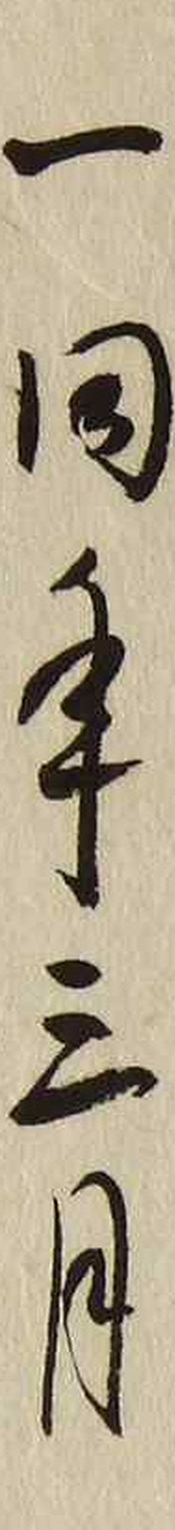一同年三月
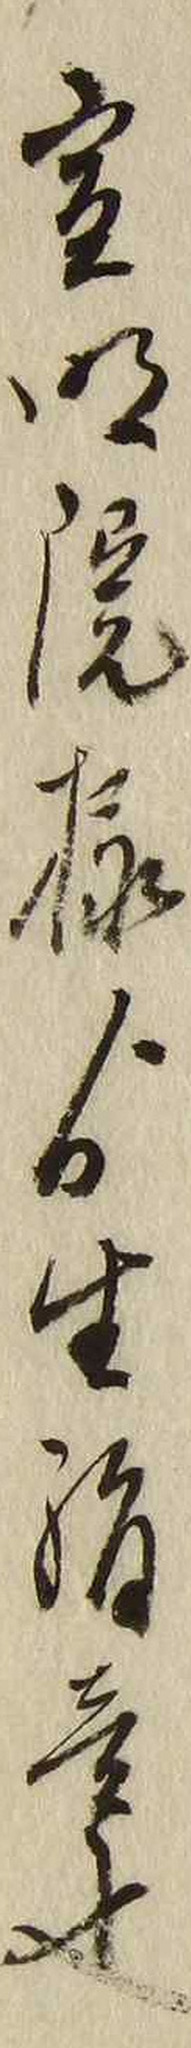宣明院様ゟ生絹壱疋

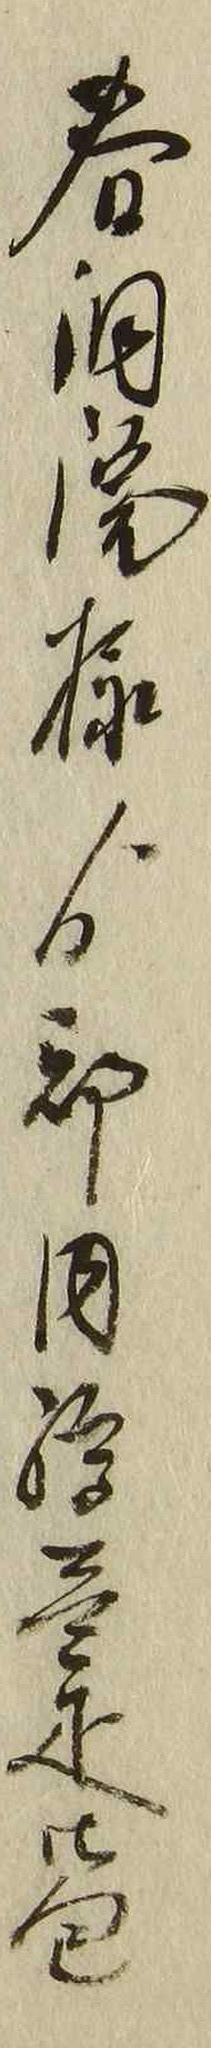春洞院様ゟ郡内縞壱疋御包
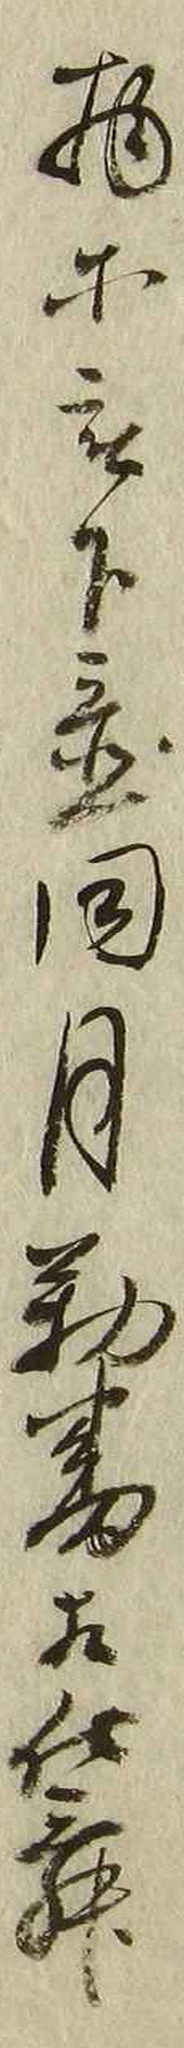物等被下置同月勤番相仕舞
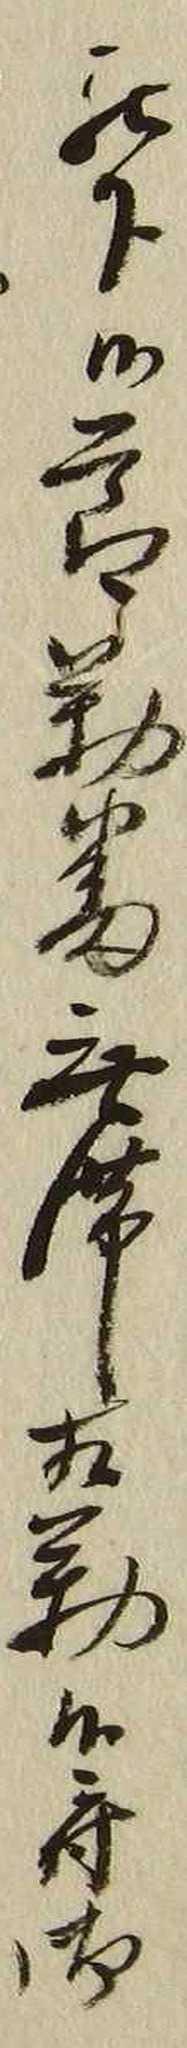罷下候節勤番無滞相勤候ニ付御
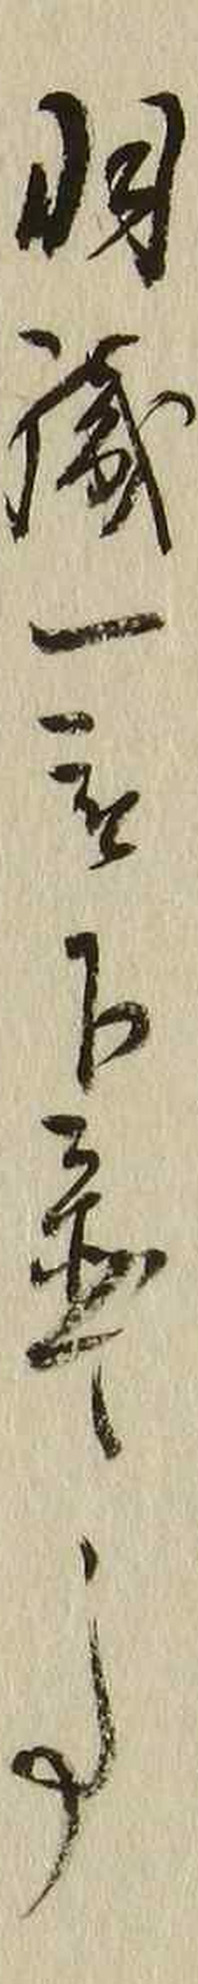羽識一被下置候事
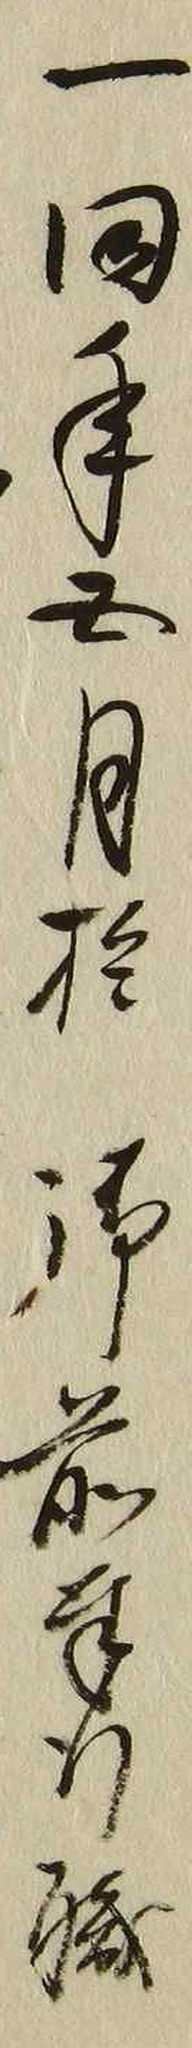一同年五月於御前奉行職
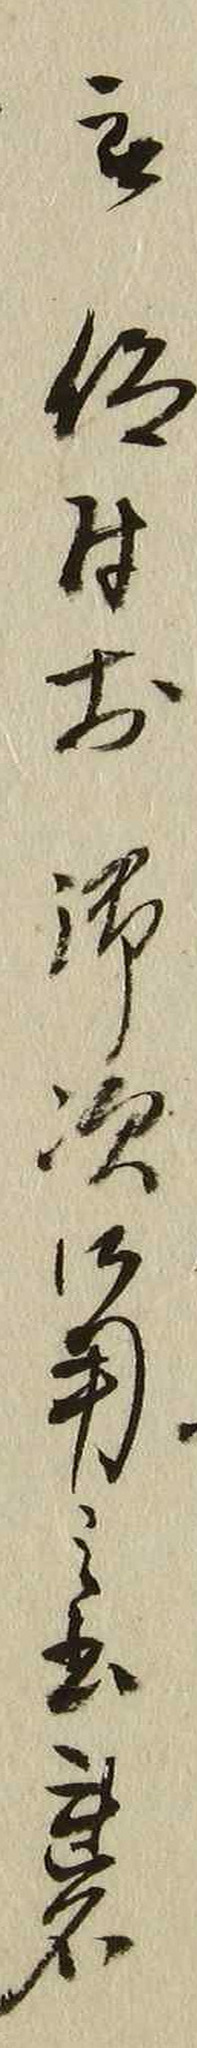被仰付於御次御用之書連名
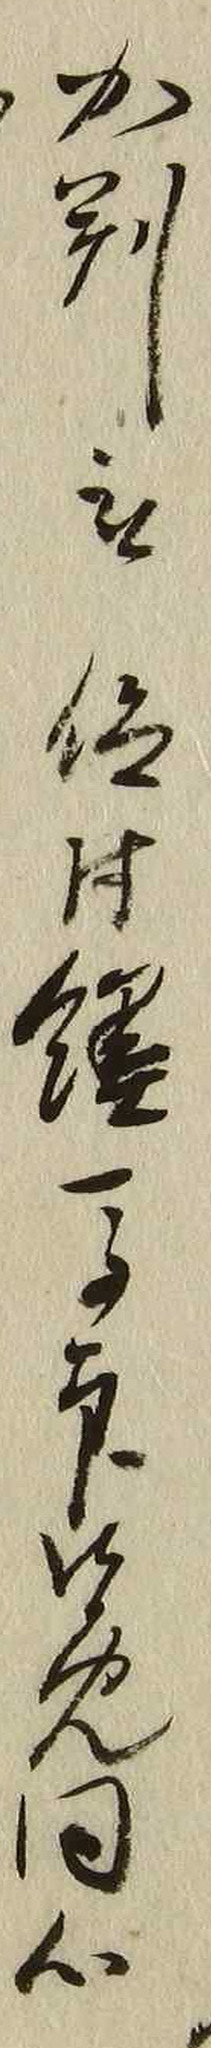加判被仰付纏馬印御免同心
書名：諸士系譜　巻之351　す之部1
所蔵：会津若松市立会津図書館
